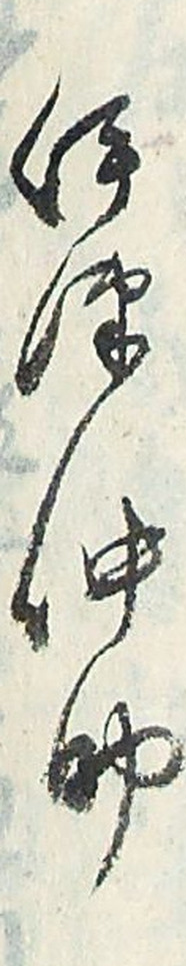伊澤仲助
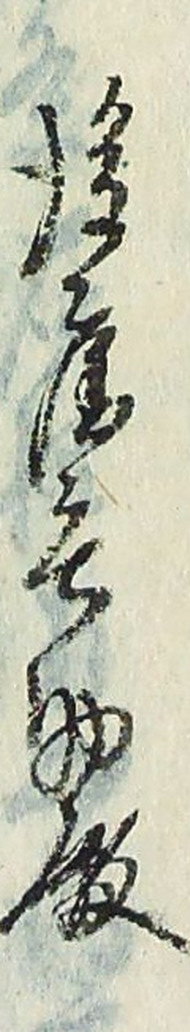後藤庄助殿
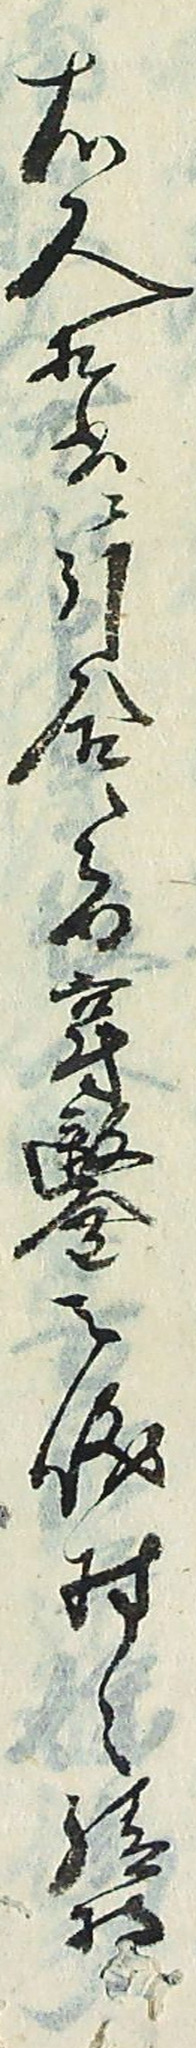右人相書に引合候者穿鑿之儀村々請持
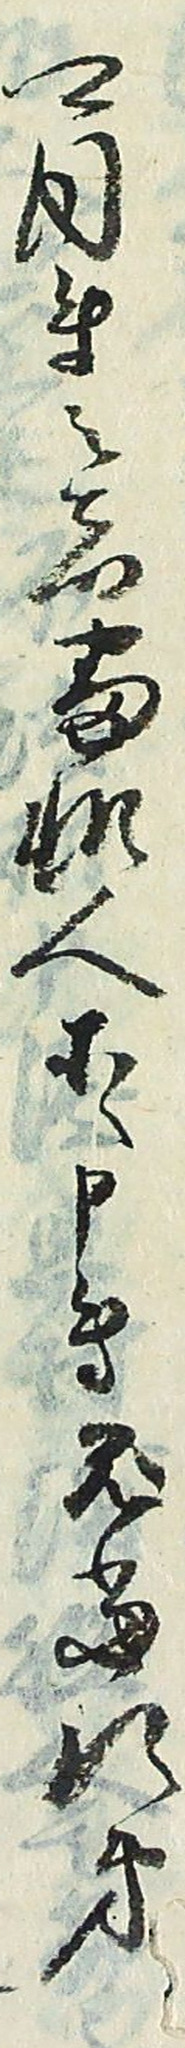郷目付之者番非人等へ申付見当次第
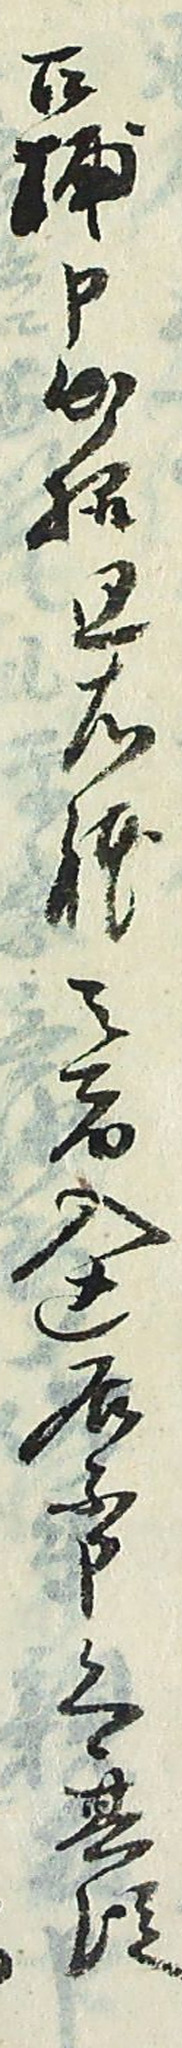召捕申出候様且右体之者入込居不申候はゝ其段
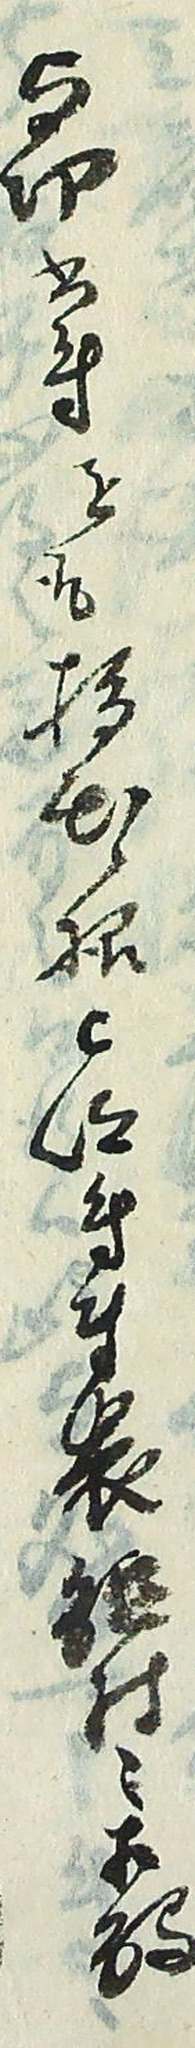与切書付を取可指出候様被仰付奉畏組村々相触
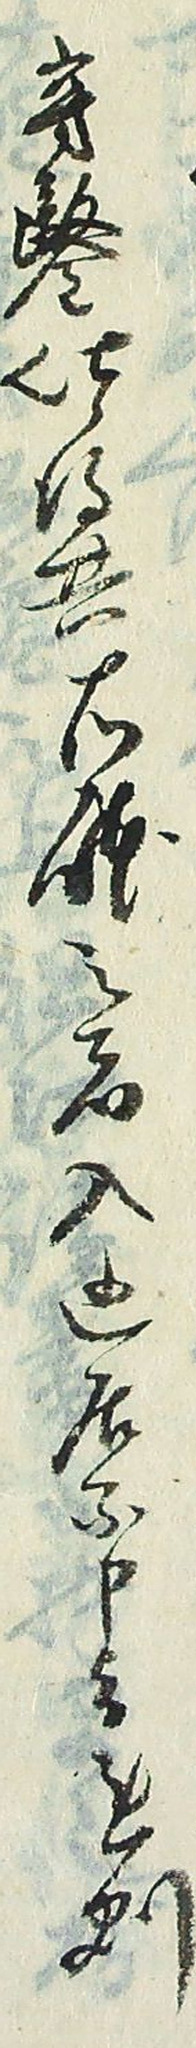穿鑿仕候得共右体之者入込居不申旨連判
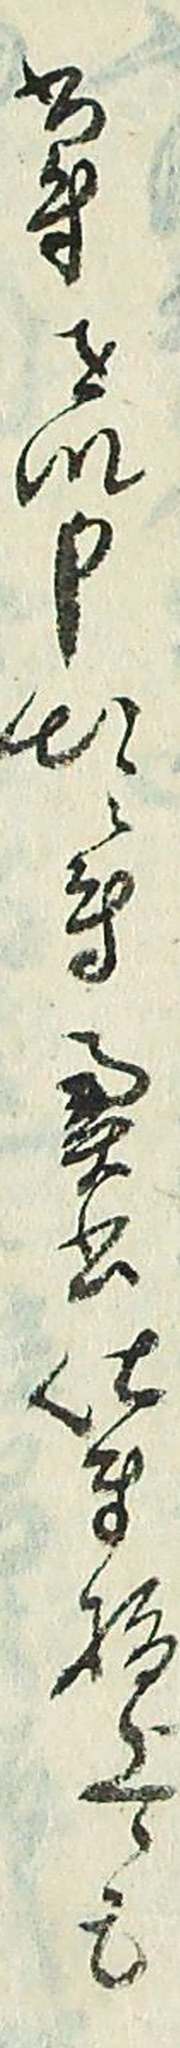書付を以申出候に付奥書仕奉指上候以上
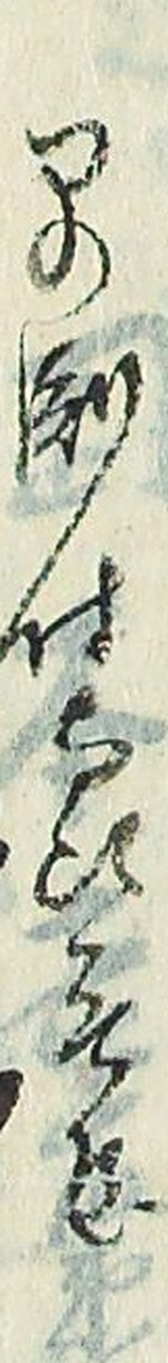早淵村与頭庄屋
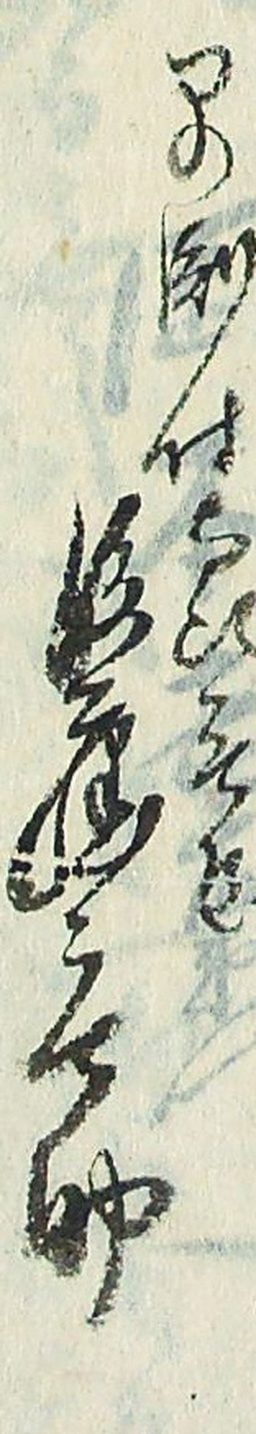後藤庄助
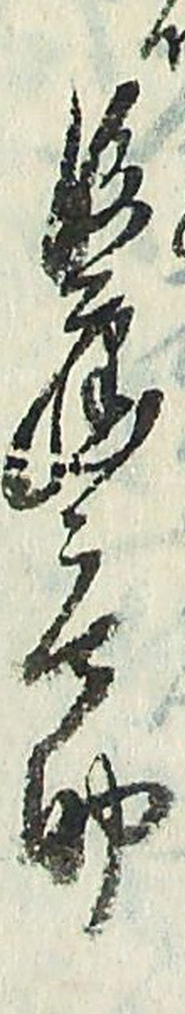後藤庄助
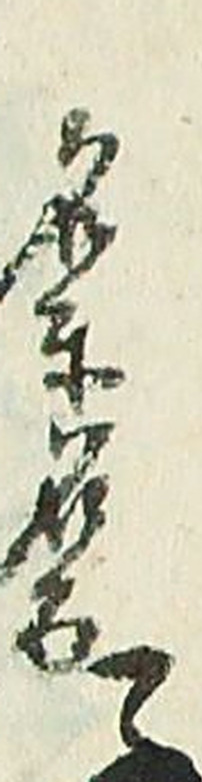名東名西
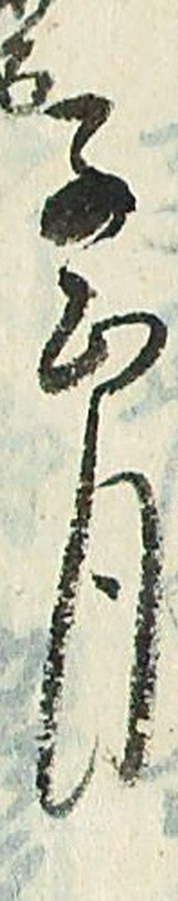子正月
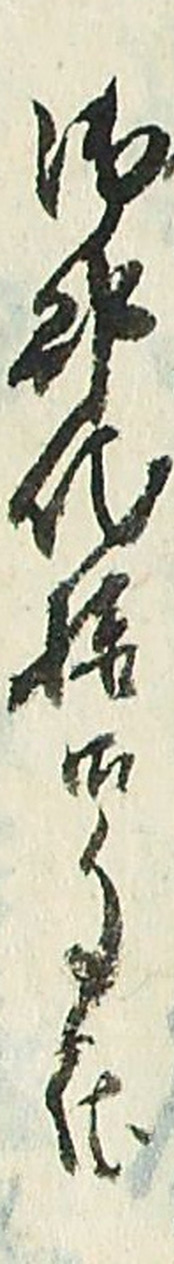御郡代様御手代
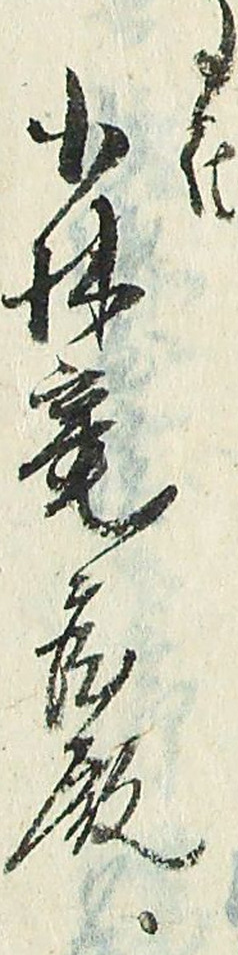小林竜蔵殿

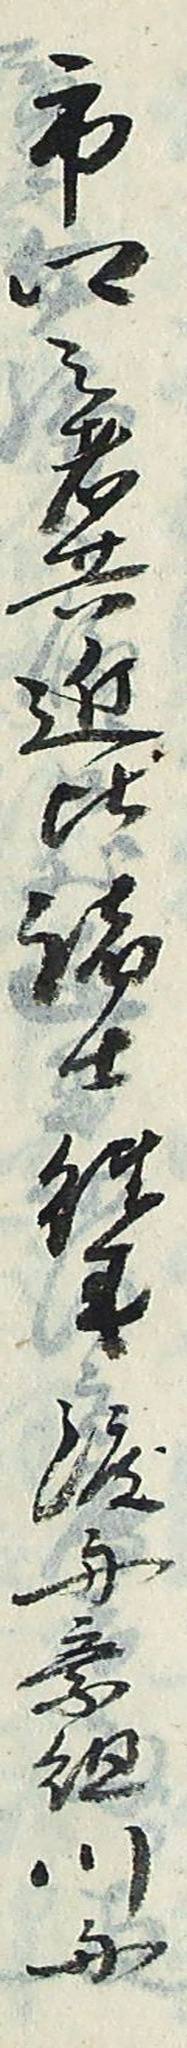市郷之者共近比諸士往来渡舟乗組川舟
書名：諸御用御□受書控
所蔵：鳴門教育大学 Naruto University of Education
